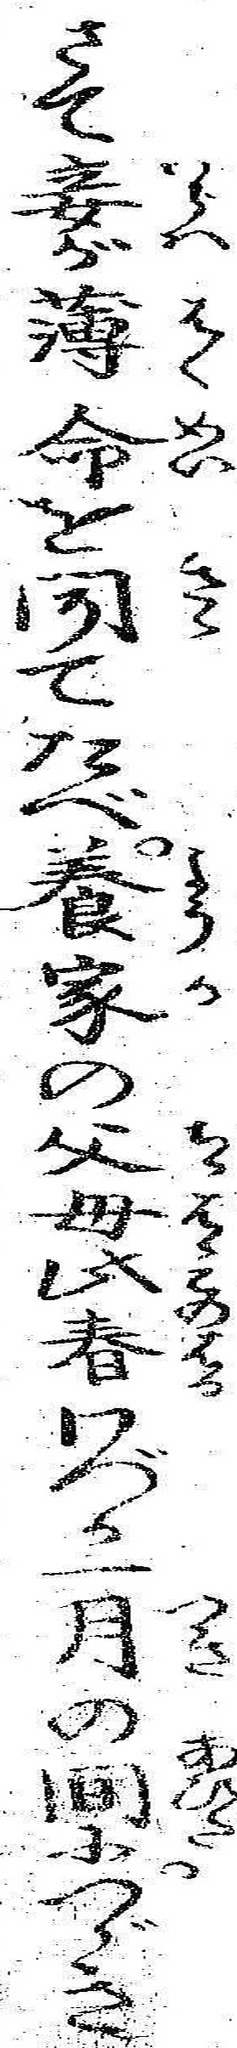さて妾が薄命を聞てたべ。養家の父母此春わづか一月の間に。つゞき
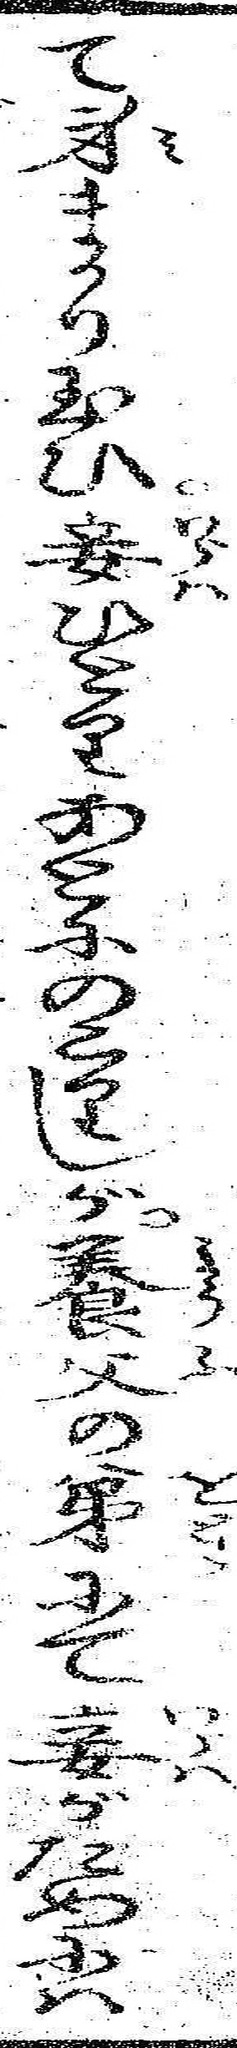て身まかり玉ひ。妾ひとりあとにのこりしが。養父の弟にて妾がためには
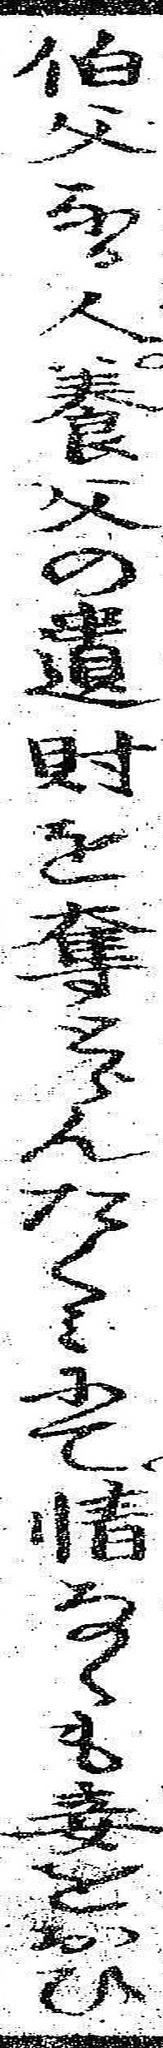伯父なる人。養父の遺財を奪とらんたくみにて。情なくも妾をおひ
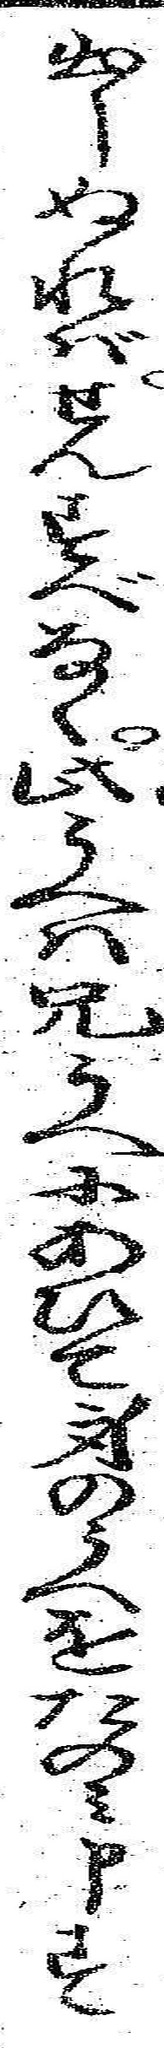出しぬれば。せんすべなく。此うへは兄うへにあひて。身のうへをたのみ申す

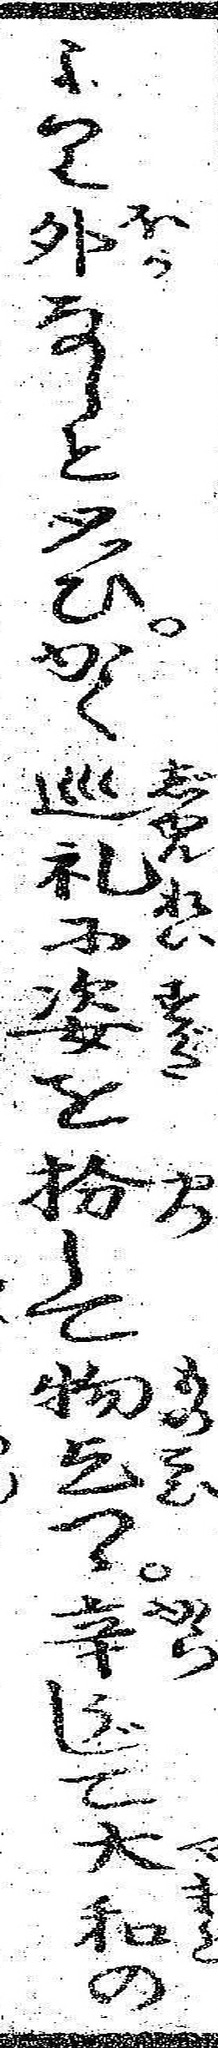より外なしと思ひ。かく巡礼に姿を扮して物乞つゝ。辛うじて大和の
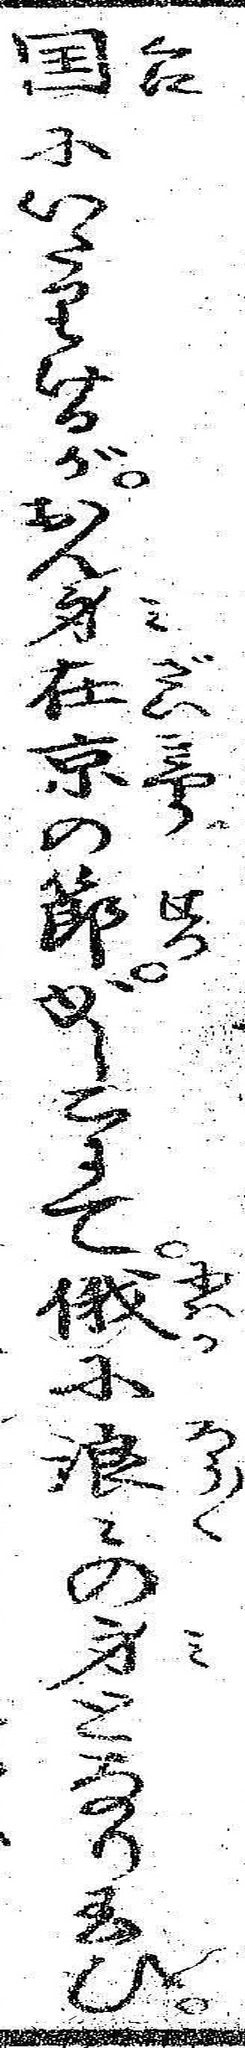国にいたりけるが。おん身在京の節。かしこにて。俄に浪々の身となり玉ひ。
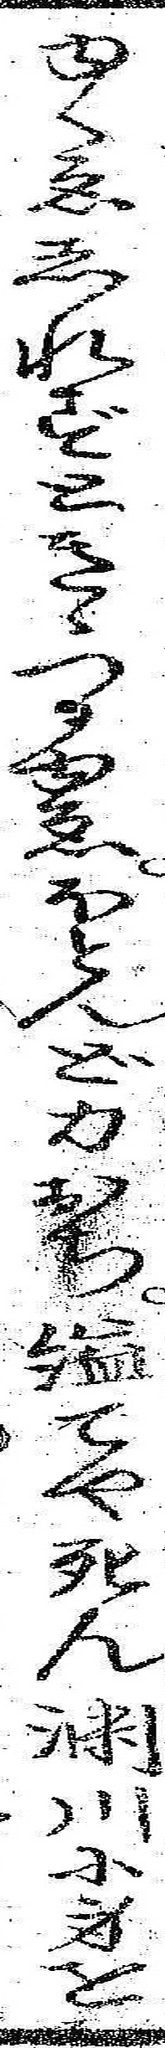ゆくゑしれずときゝつるゆゑ。ほとんど力おち。縊てや死ん。淵川に身を
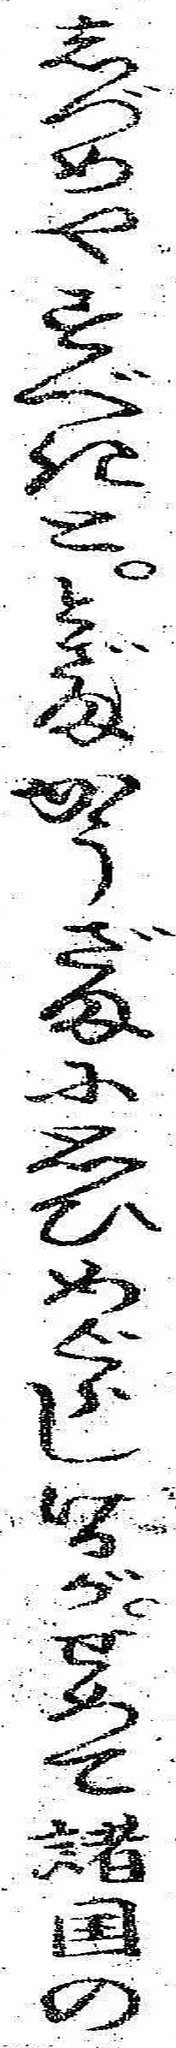しづめやすべきと。とざまかうざまに思ひめぐらしけるが。せめて諸国の
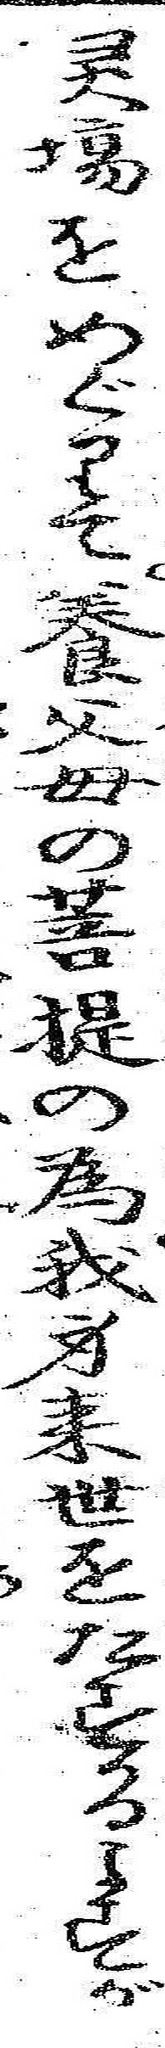霊場をめぐりて。養父母の菩提の為。我身来世をたすかるよすが
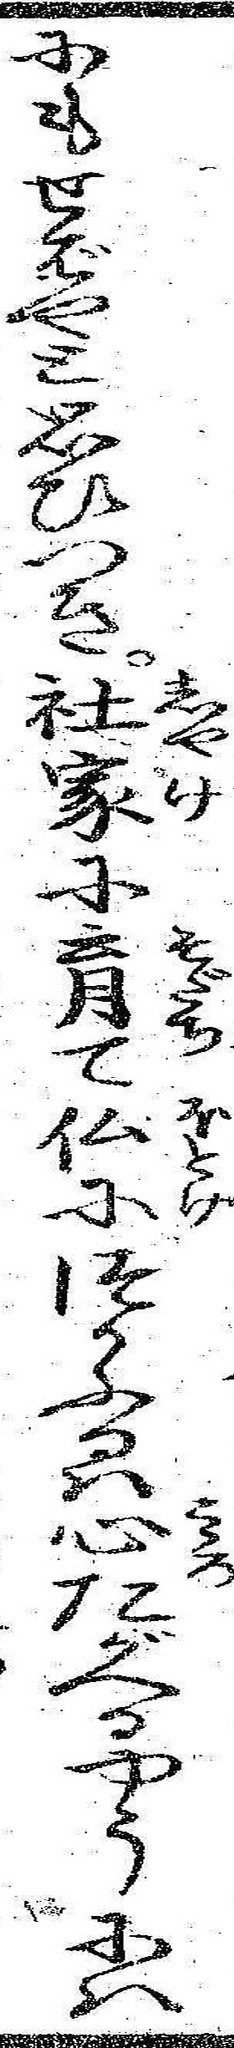にもせばやと思ひつき。社家に育て仏につかふるは心たがへるやうには
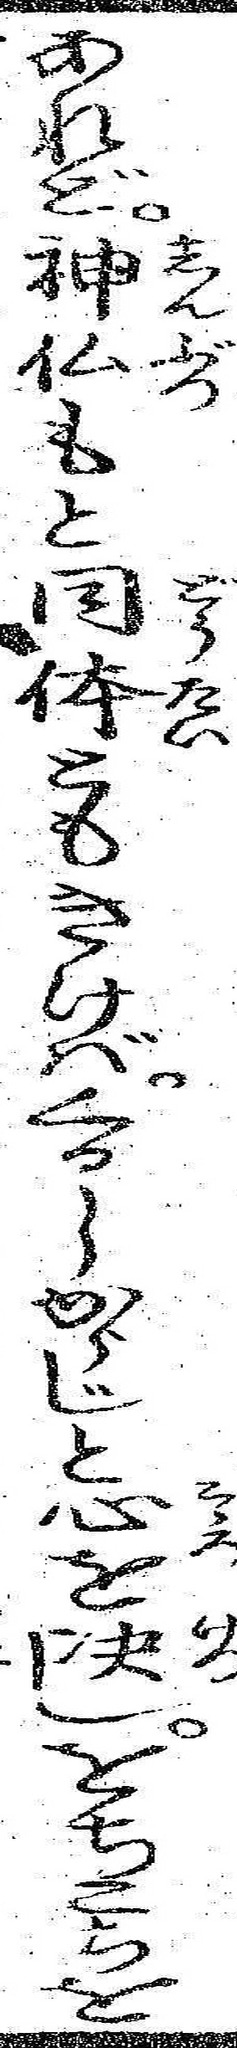あれど。神仏もと同体ともきけば。くるしからじと心を決し。をちこちを
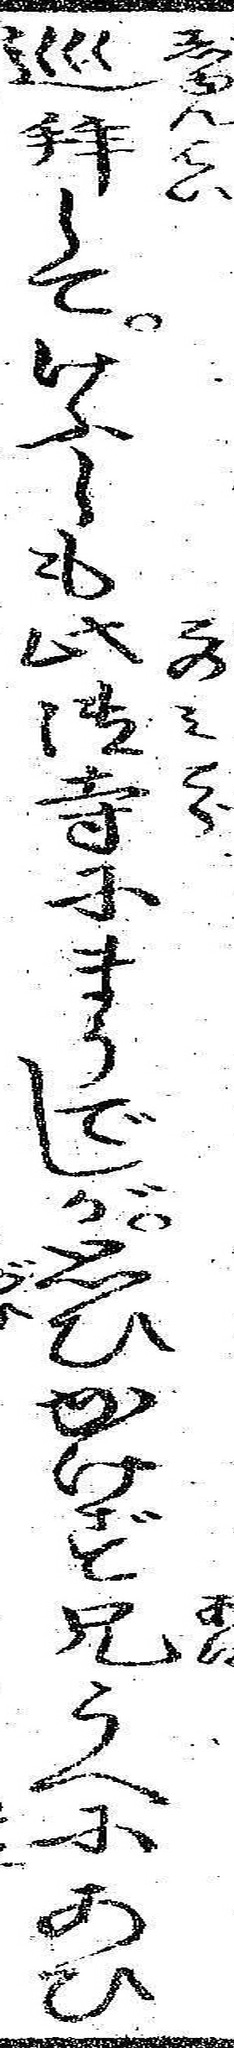巡拝して。けふしも此御寺にまうでしが。思ひかけず兄うへにあひ
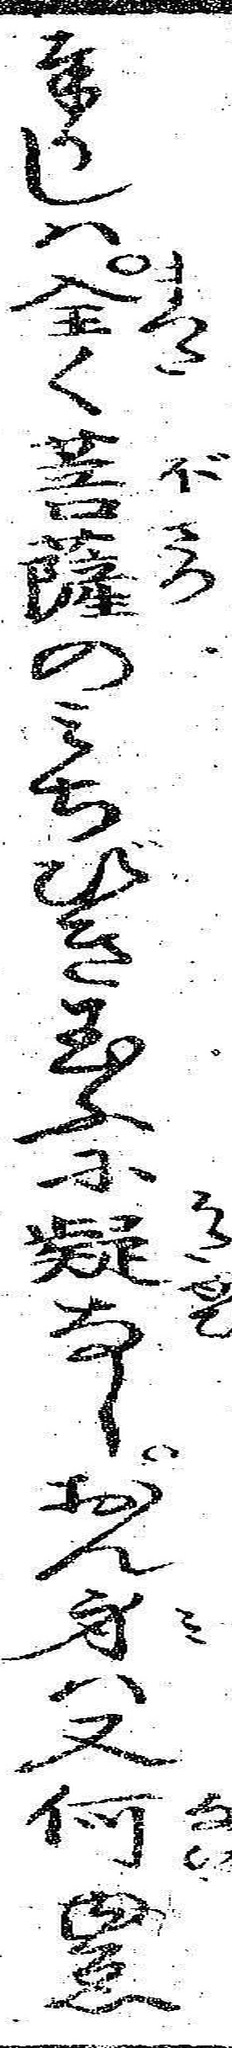奉りしは。全く菩薩のみちびき玉ふに疑なし。おん身は又何ゆゑ
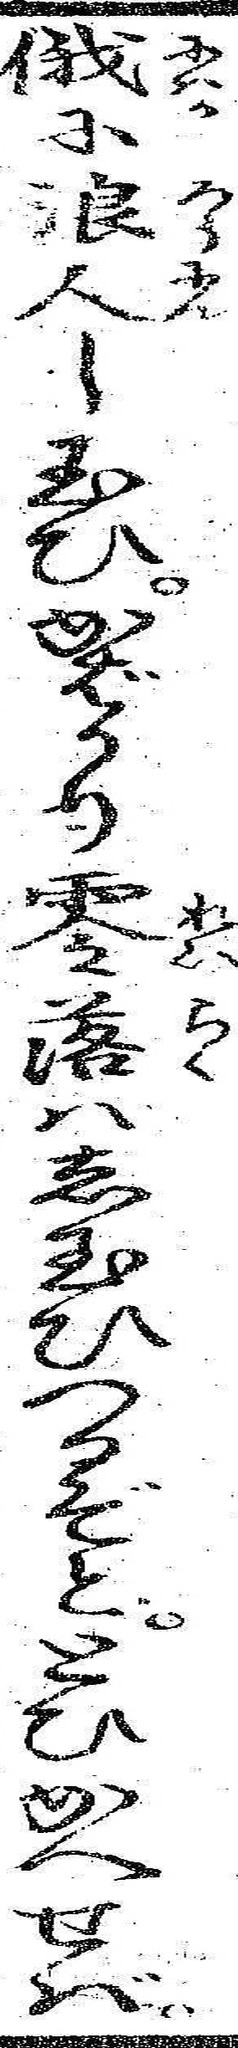俄に浪人し玉ひ。かばかり零落はし玉ひつるぞと。とひかへせば。
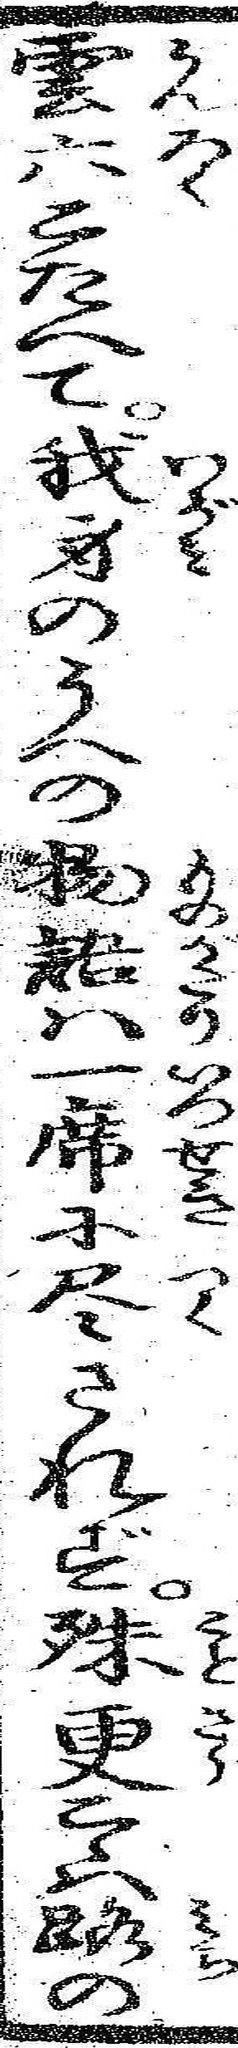雲六こたへて。我身のうへの物語は一席に尽されず。殊更こゝは路の
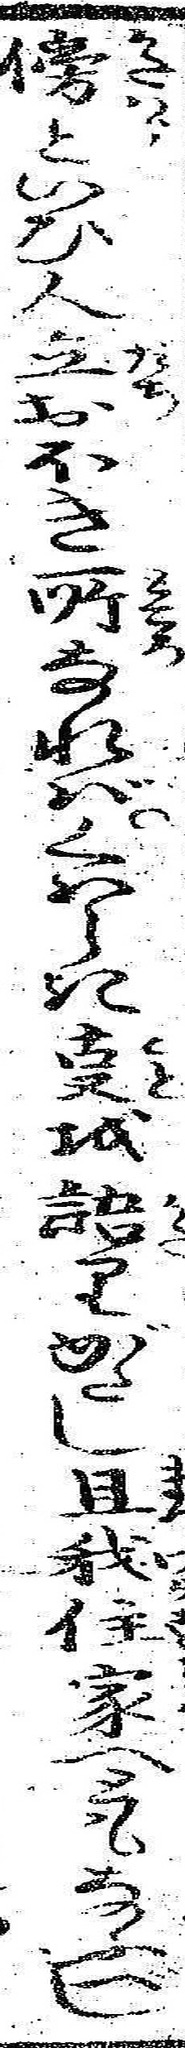傍といひ人立おほき所なれば。くはしき事を語りがたし。且我住家へともなふべし
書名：昔話稲妻表紙
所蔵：国文学研究資料館
